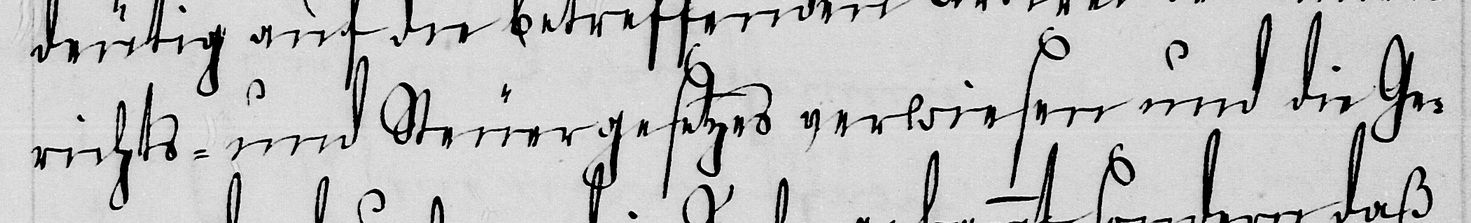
richts- und Steuergesetzes verwiesen und die Ge¬
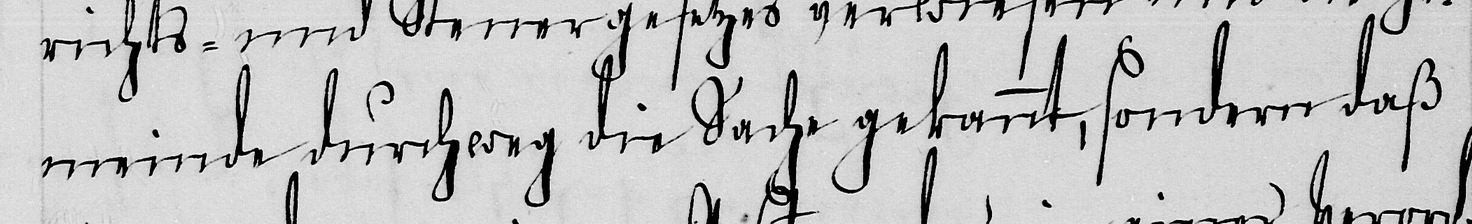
meinde durchweg die Sache gekannt, sondern daß
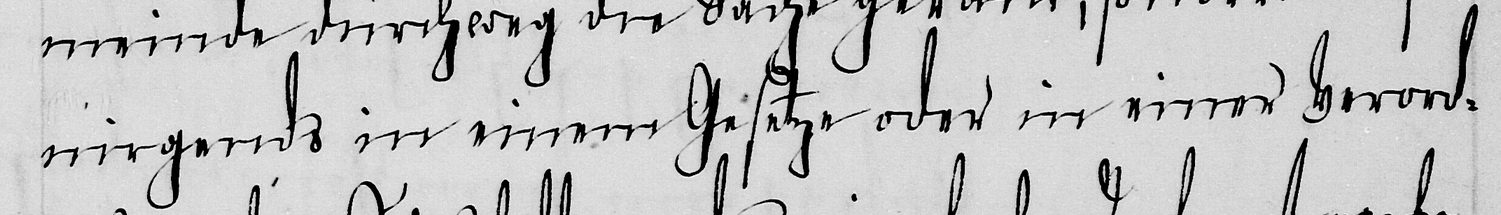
nirgends in einem Gesetze oder in einer Verord¬
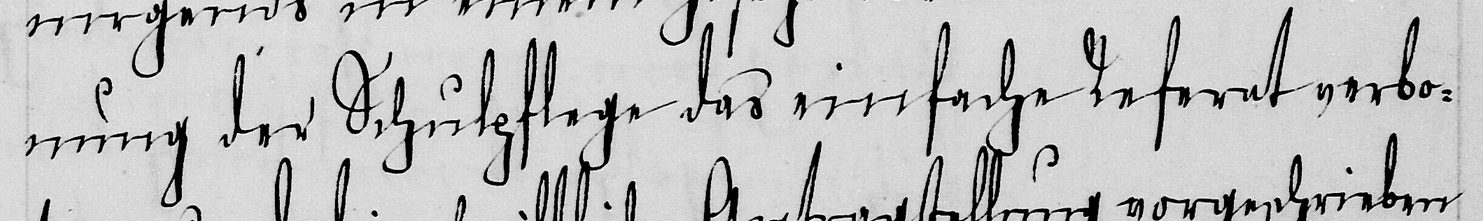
nung der Schulpflege das einfache Referat verbo¬
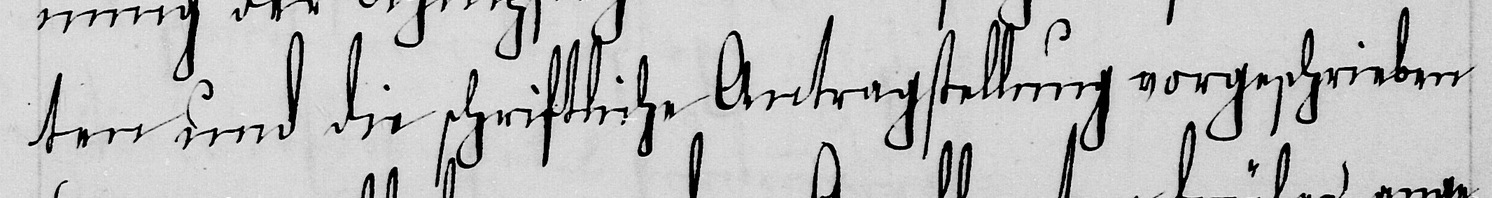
ten und die schriftliche Antragstellung vorgeschrieben
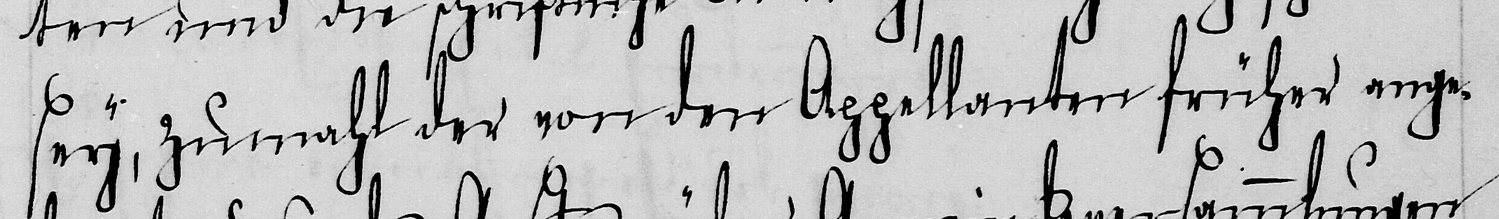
sey, zumahl der von den Appellanten früher ange¬
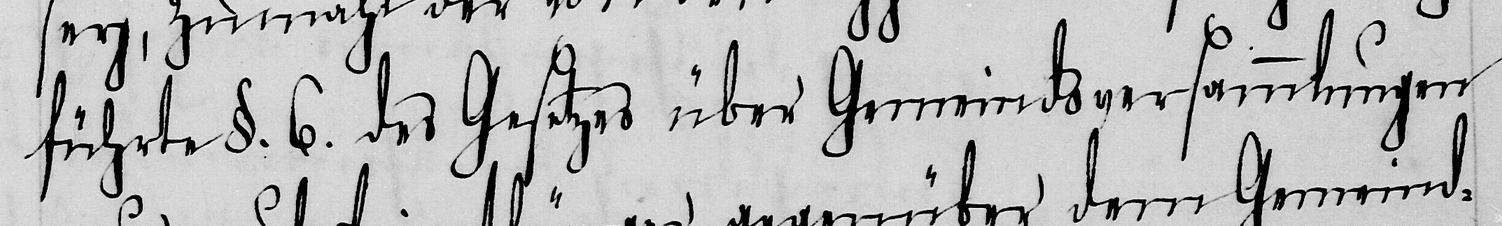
führte §. 6. des Gesetzes über Gemeindsversammlungen
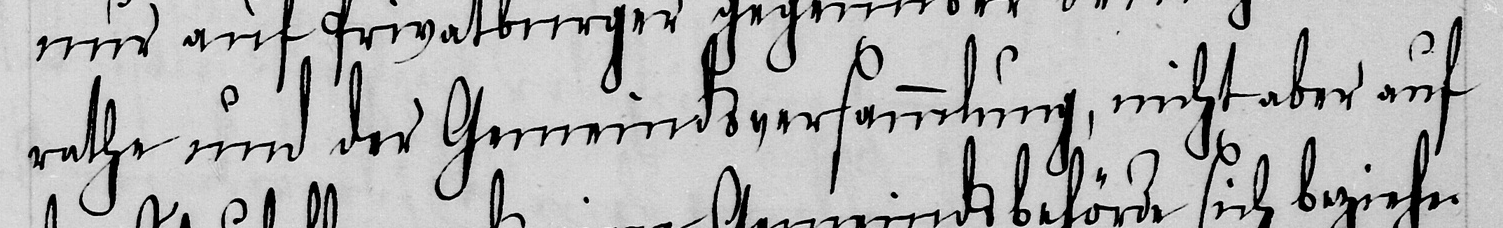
rathe und der Gemeindsversammlung, nicht aber auf
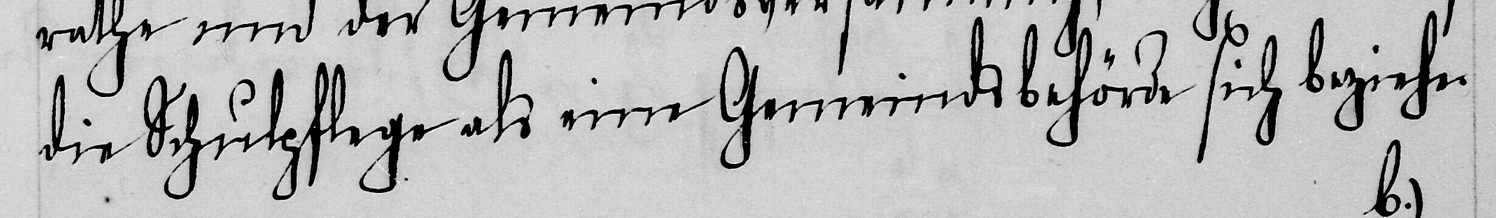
die Schulpflege als eine Gemeindsbehörde sich bezieh¬
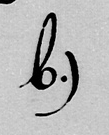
e.
